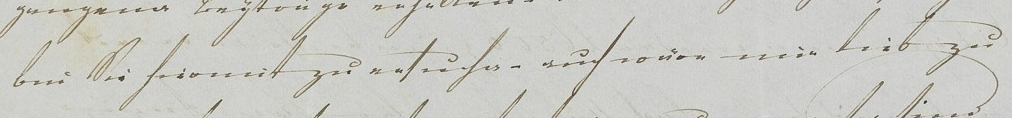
bin Sie hiermit zu ersuchen – auch wäre mir lieb zu
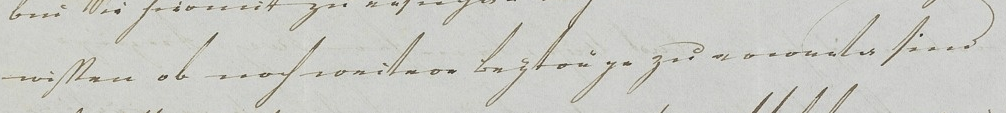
wissen ob noch weitere Beyträge zu erwarten sind
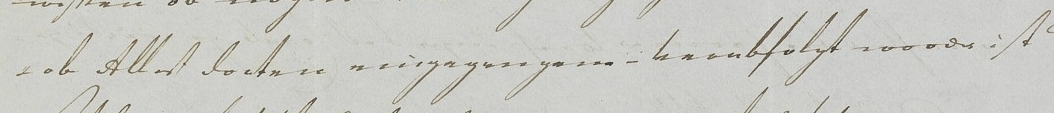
& ob Alles dorten eingegangene – verabfolgt worden ist?
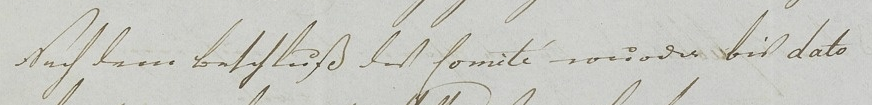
Nach dem Beschluß des Comité wurde bis dato
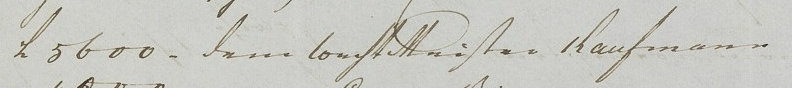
L 5600 dem Wachtmeister Kaufmann
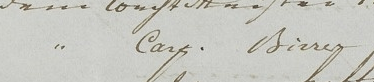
dem Corp. Birrer
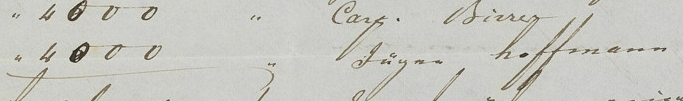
" 4000 dem Jäger Hoffmann
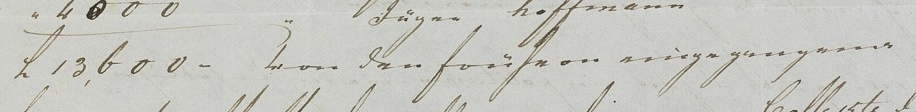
L 13, 600 – Von den frühern eingegangenen
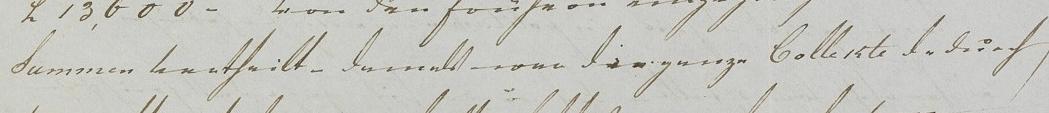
Summen vertheilt – damals war die ganze Collekte dadurch
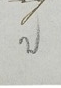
von
